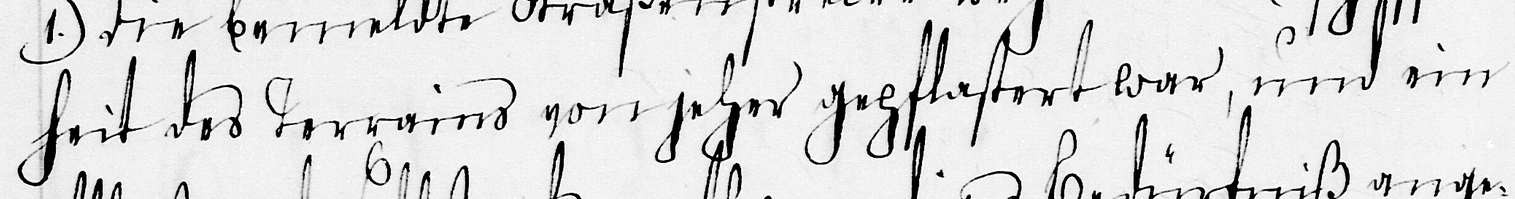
heit des Terrains von jeher gepflastert war, und ein
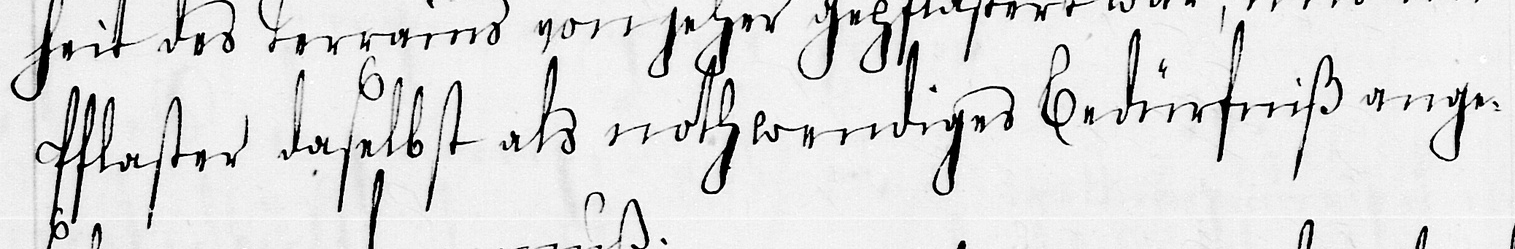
Pflaster daselbst als nothwendiges Bedürfniß ange¬
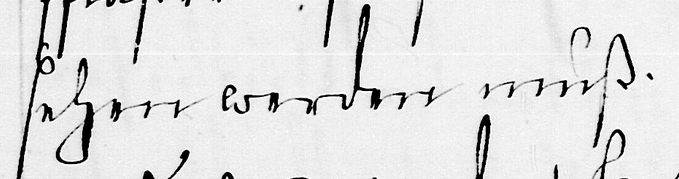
sehen werden muß.
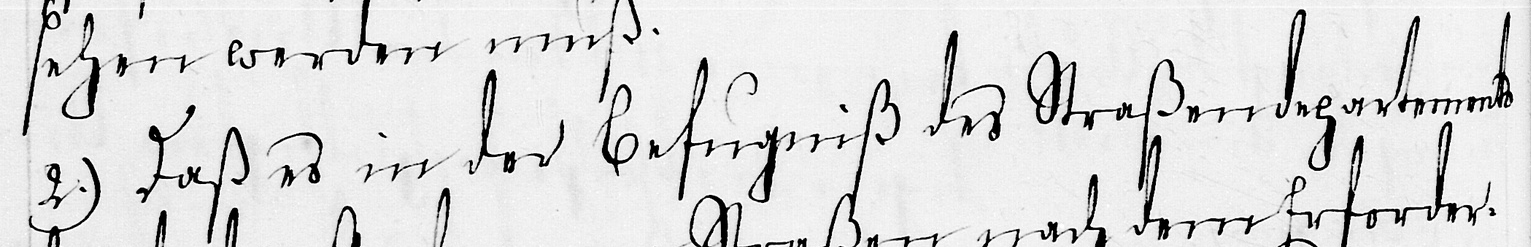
2.) Daß es in der Befugniß des Straßendepartemen¬
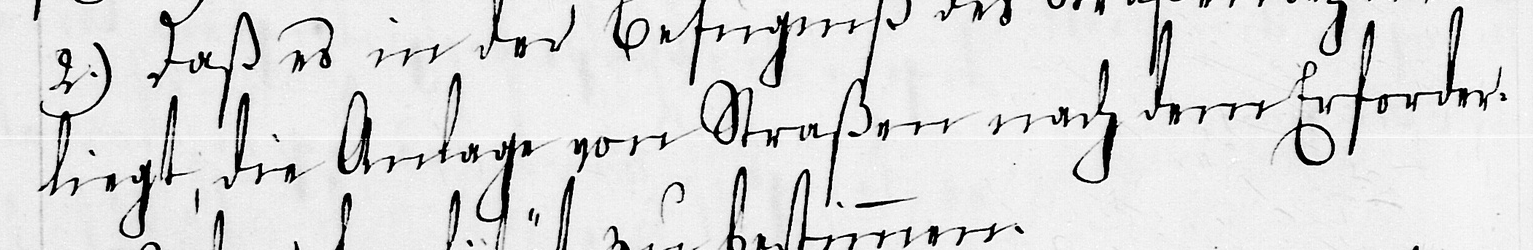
liegt, die Anlage von Straßen nach dem Erforder¬
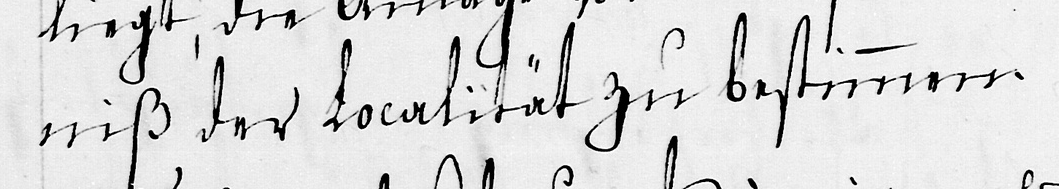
niß der Localität zu bestimmen.
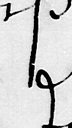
ts
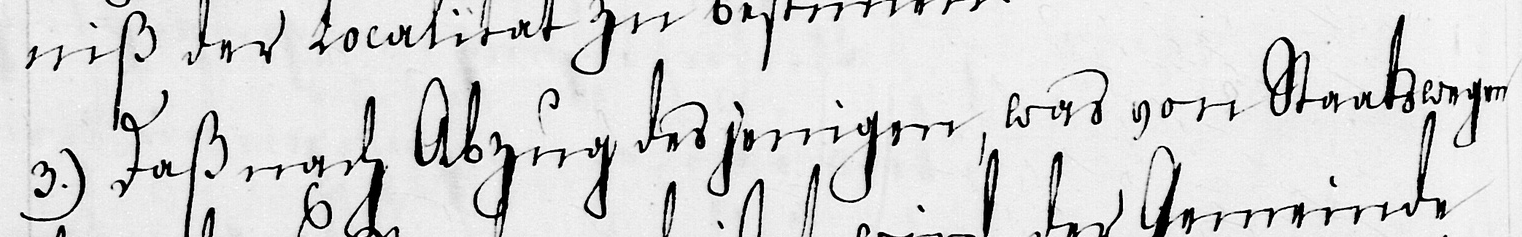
3.) Daß nach Abzug desjenigen, was von Staatswegen
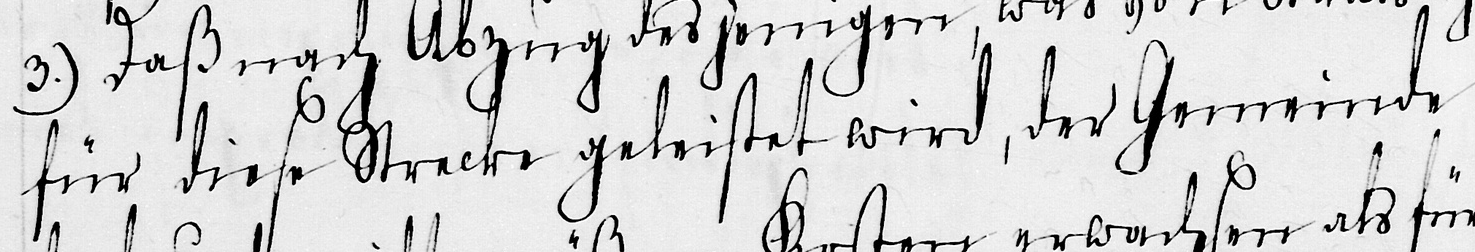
für diese Strecke geleistet wird, der Gemeinde
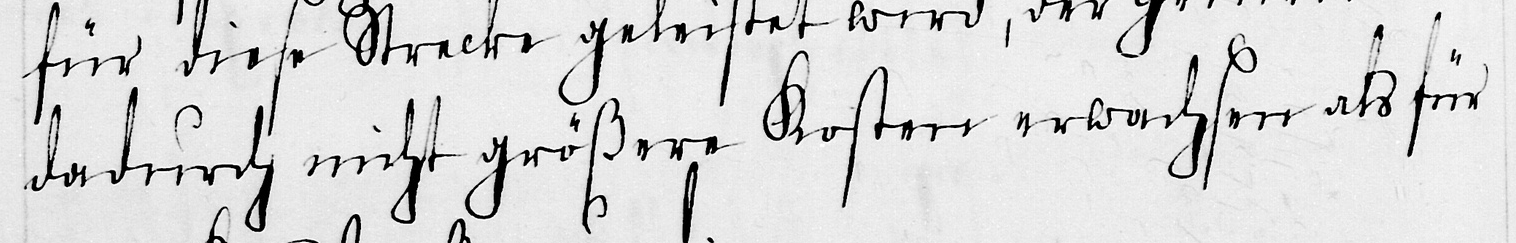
dadurch nicht größere Kosten erwachsen als für
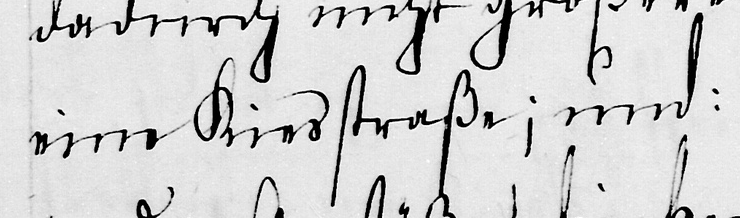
eine Kiesstraße; und:
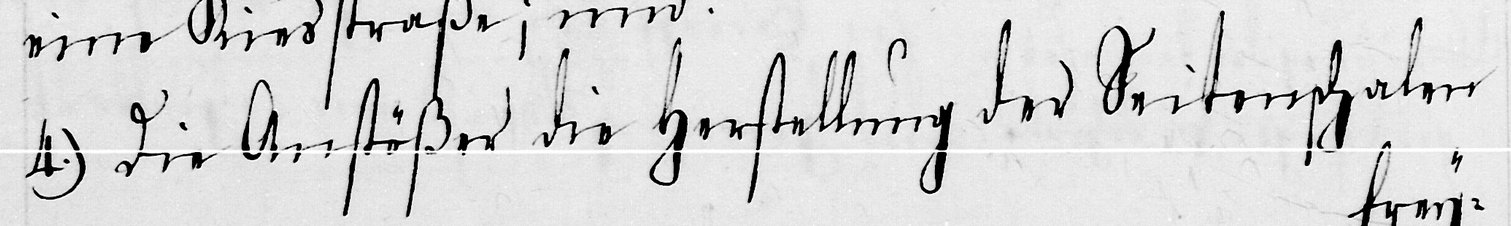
4.) Die Anstößer die Herstellung der Seitenschalen
